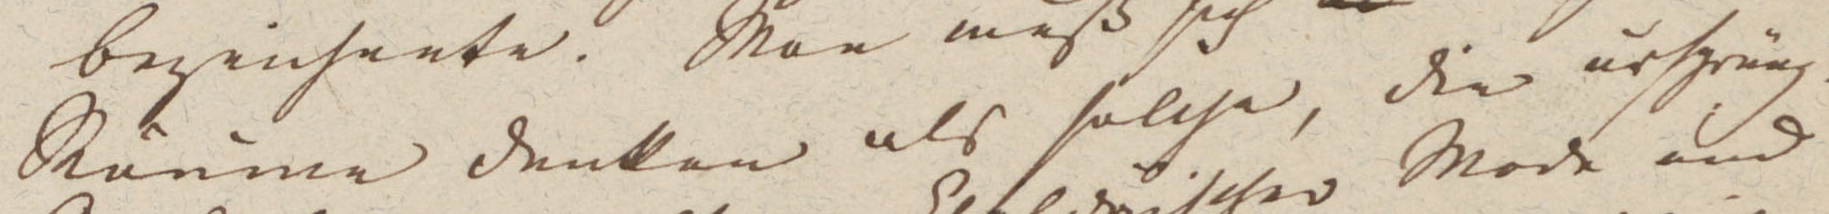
Räume denken als solche, die ursprüng-
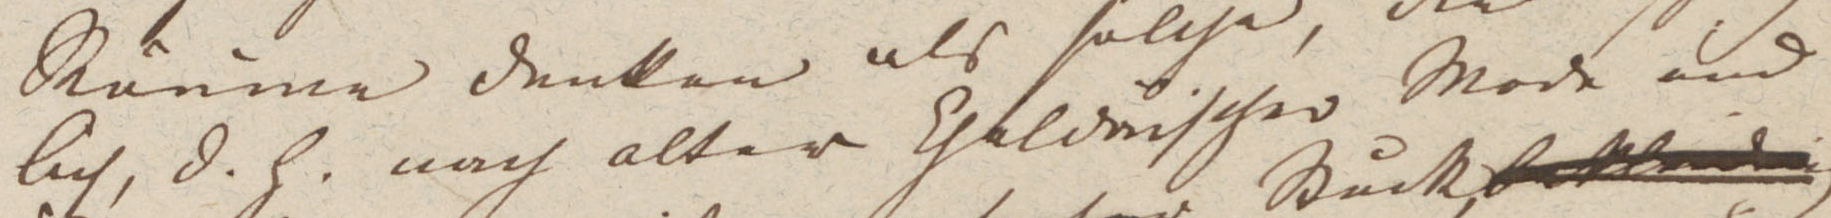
lich, d. h. nach alter Chaldäischer Mode und
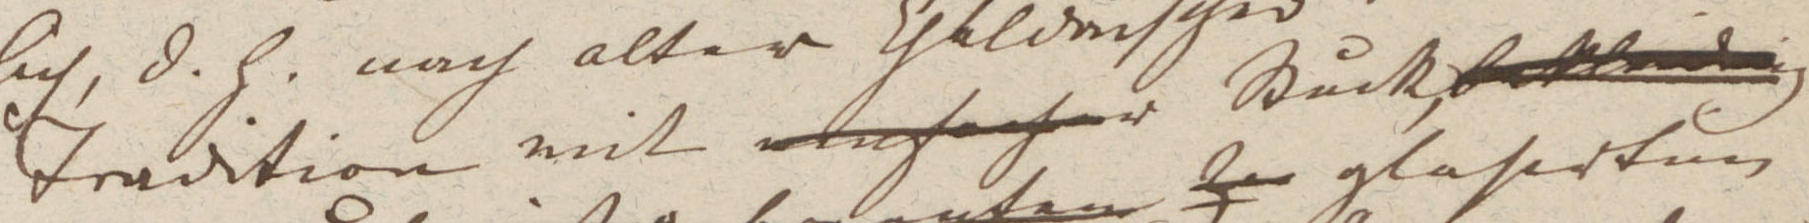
Tradition mit einfacher Stuckbekleidung
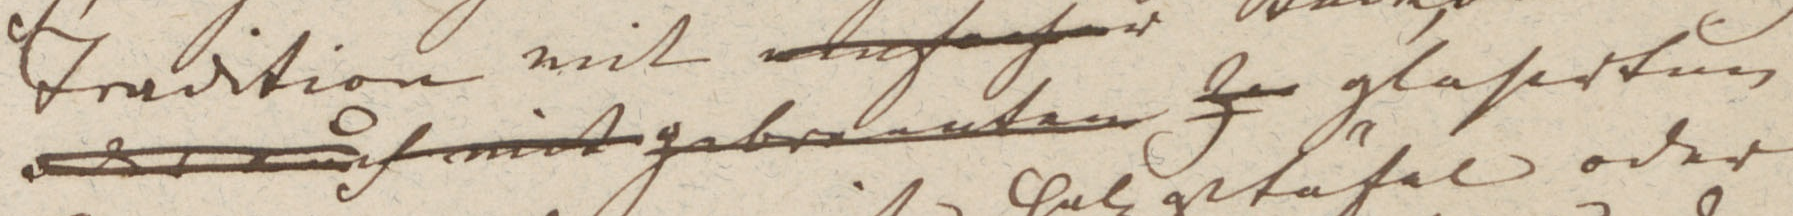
der auch mit gebrannten Zie glasirten
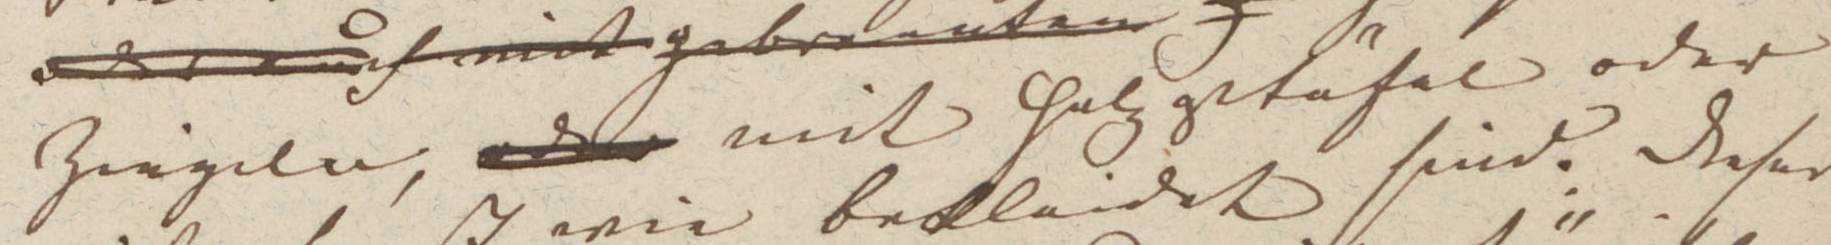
Ziegeln oder mit getäfel oder
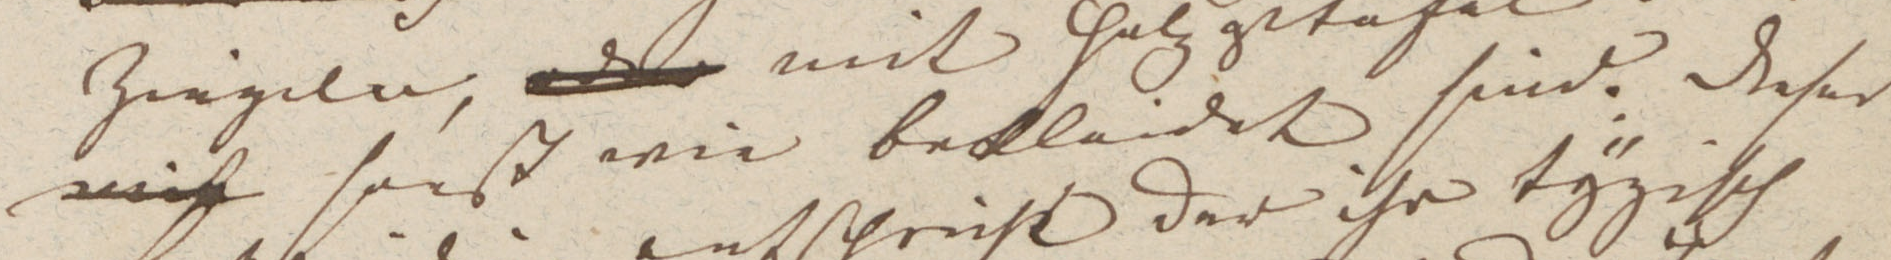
mi sonst wie bekleidet sind. Dieser
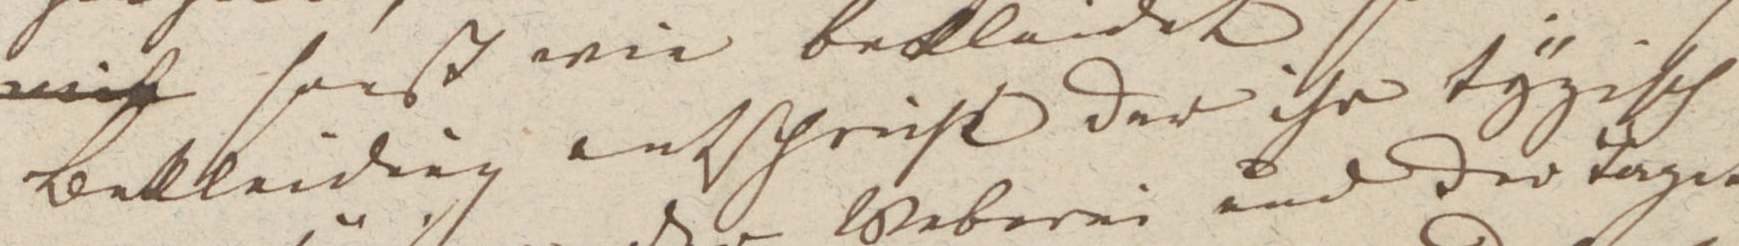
Bekleidung entspricht der ihr typisch
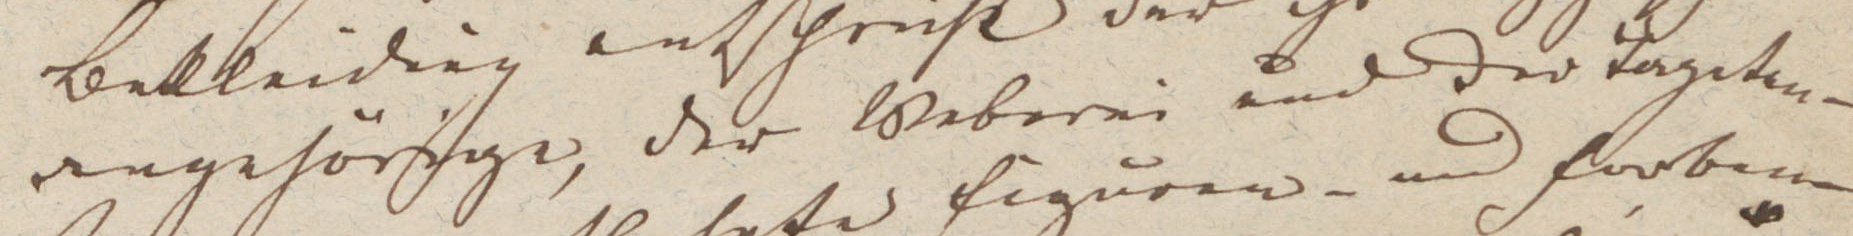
angehörige, der Weberei und der Tapeten-
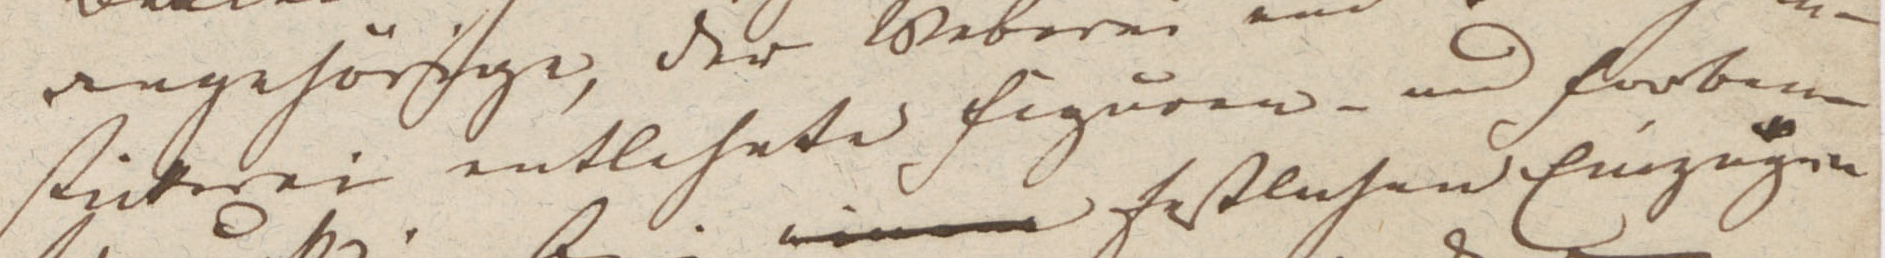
stickerei entlehnte Figuren- und Farben-
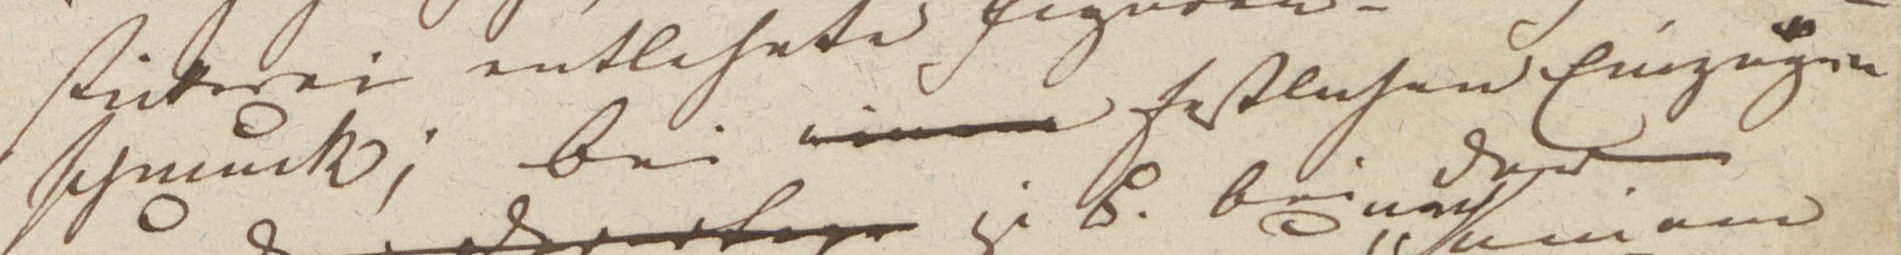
schmuck; bei einem festlichen Einzuügen
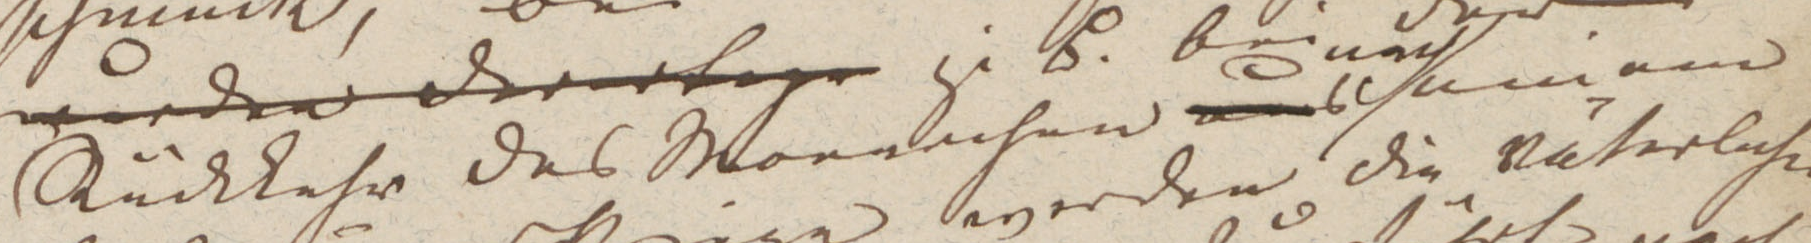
Rückkehr des Monarchen aus nach einem
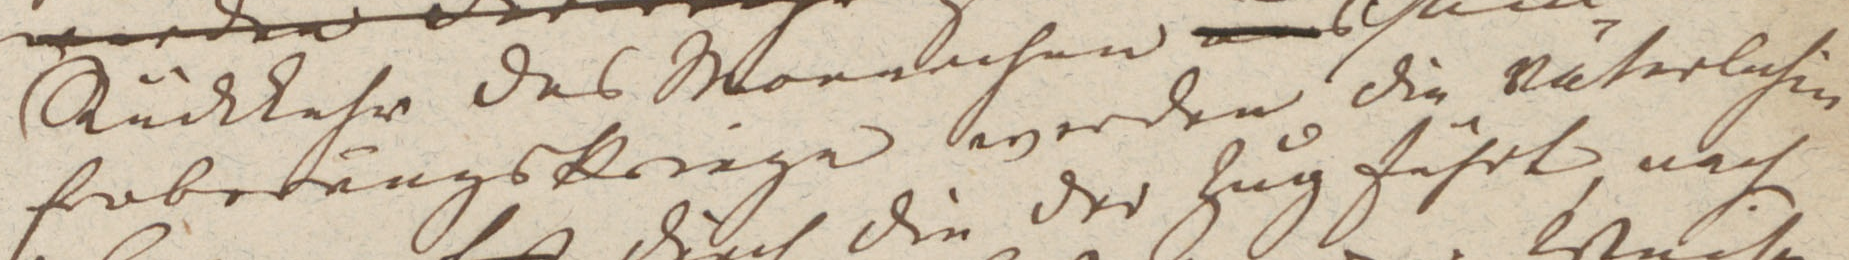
Eroberungskriege werden die väterlichen
